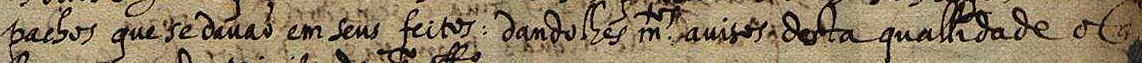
pachos que se dauaõ em seus feitos: dandolhes m.tos auisos desta quallidade o q̄
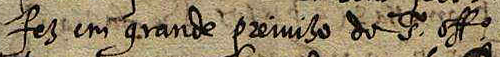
fez em grande preiuizo do s.to offo.
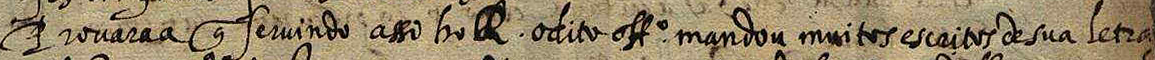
Prouaraa q̄ seuuindo assi ho R. o dito offo. mandou muitos escritos de sua letra
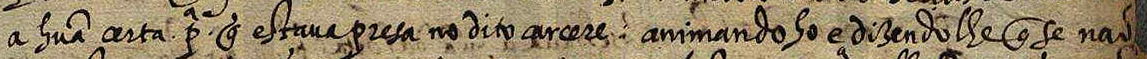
a huā certa pa. q̄ estaua presa no dito carcere: animando ho e dizendolhe q̄ se naõ
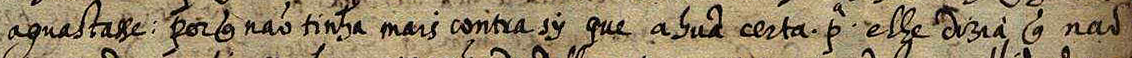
aguastasse: porq̄ não tinha mais contra sy que a huā certa. pa. e lhe dizia q̄ naõ
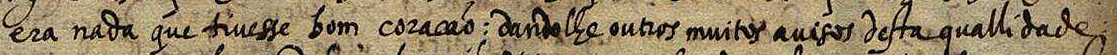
era nada que tiuesse bom coraçaõ: dandolhe outros muitos auisos desta quallidade
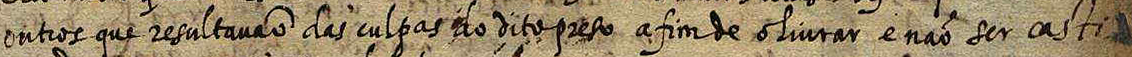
outros que resultauaõ das culpas do dito preso a fim de o liurar e naõ ser casti
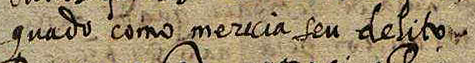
guado como merecia seu delito.
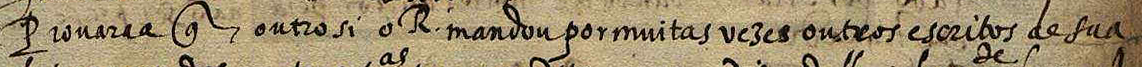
Prouaraa q̄ outrosi o R. mandou por muitas vezes outros escritos de sua
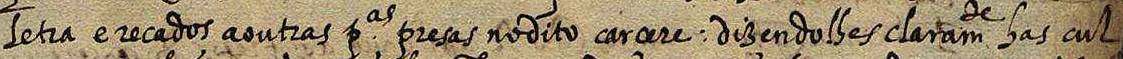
Letra e recados a outras p.as presas no dito carcere: dizendolhes claramte has cul
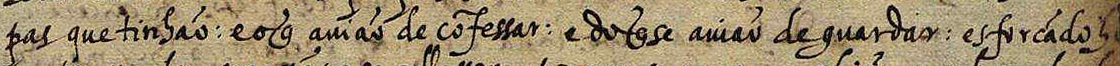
pas que tinhaõ: e o q̄ auiaõ de cōfessar: e do q̄ se auiaõ de guardar: esforçādo ha
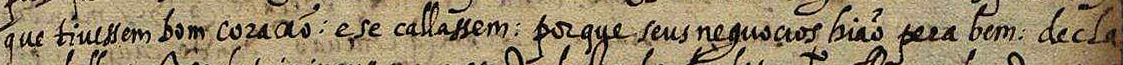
que tiuessem bom coraçaõ: e se callassem: porque seus neguocios hiaõ pera bem: decla
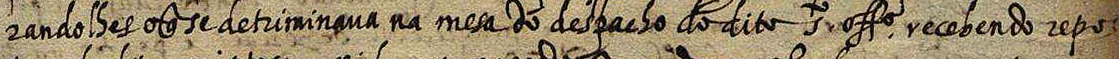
randolhes o q̄ se detriminaua na mesa do despacho do dito sto. offo. recebendo repos
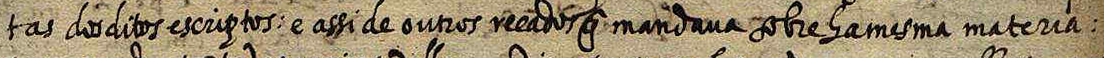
tas dos ditos escriptos: e assi de outros recados q̄ mandaua sobre ha mesma materia:
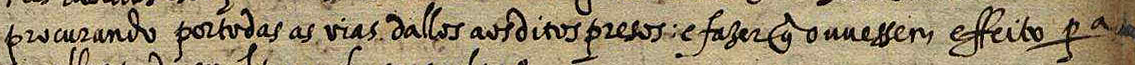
procurando por todas as vias dallos aos ditos presos: e fazer q̄ ouuessem effeito ꝑa
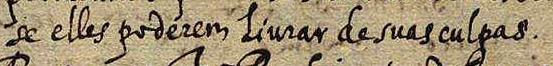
se elles poderem Liurar de suas culpas.
